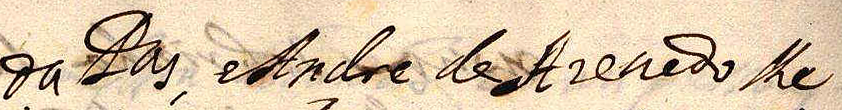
da Pas, e Andre de Azeuedo lhe
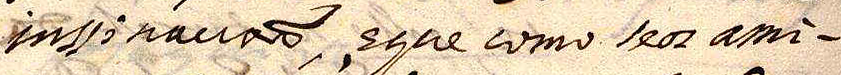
inssinauaõ, E que como seos ami
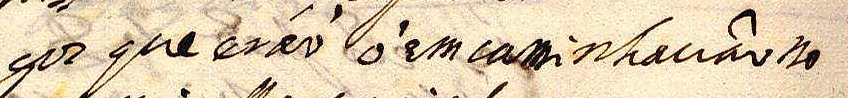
gos que eraõ o emcaminhauaõ no
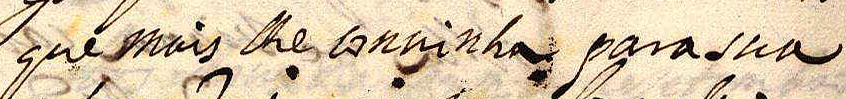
que mais lhe conuinha para sua
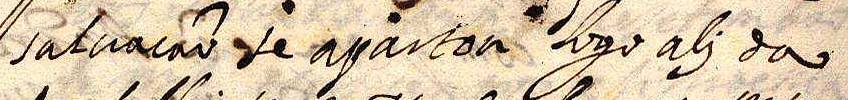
saluaçaõ se apartou logo alj da
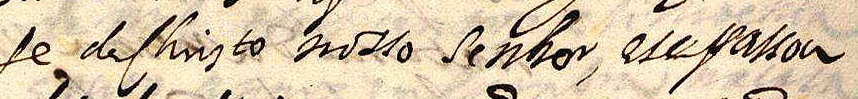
fe de Christo nosso senhor, E se passou
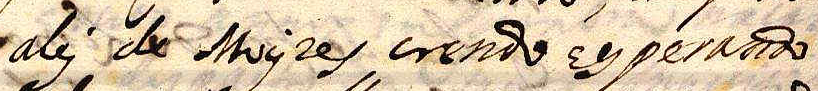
a lej de Moyzes crendo E esperando
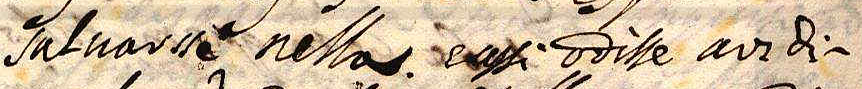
saluarsse nella. E assi o disse aos di
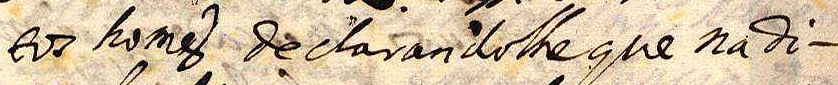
tos homēs declarandolhe que na di
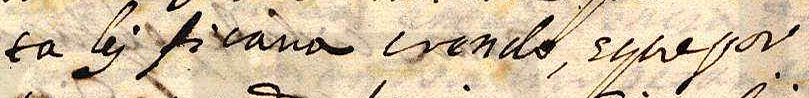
ta lej ficaua crendo, E que por
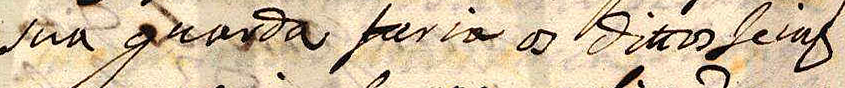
sua guarda faria os dittos Jeiūs
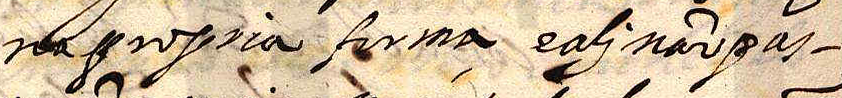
na propria forma, e alj naõ pas
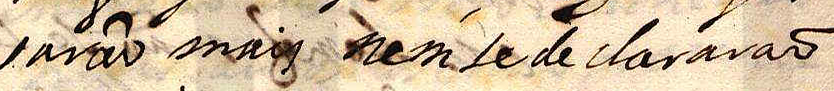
saraõ mais nem se declararaõ
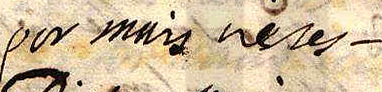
por mais uezes
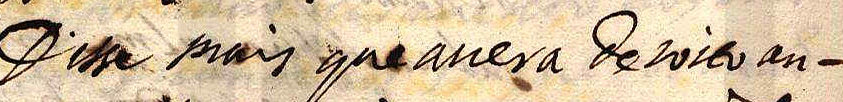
Disse mais que auera dezoito an
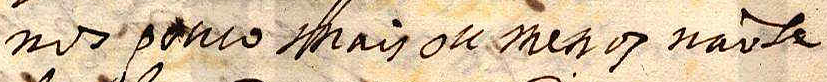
nos pouco mais ou menos naõ se
